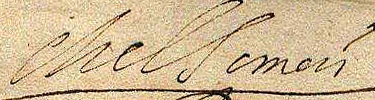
Mel Simoĩs
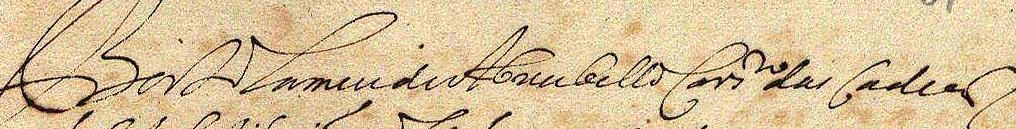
Bertolameu de Abreu bello Carsro das Cadeas
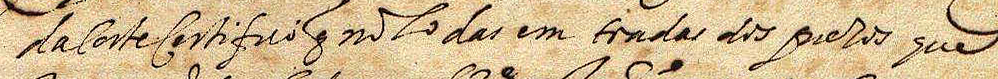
da Corte Certifico q̄ no Lo das emtradas dos prezos que
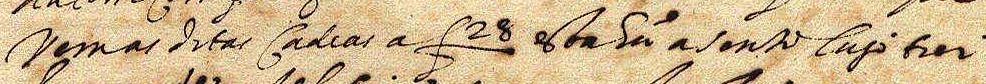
vem as ditas Cadeas a f 28 esta hū asento cujo teor
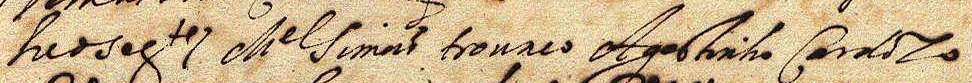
he o segte / Mel Simoĩs trouxeo Agostinho CardoZo
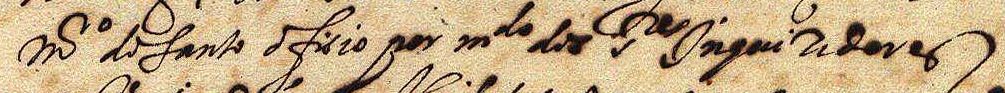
mro do santo ofisio por mdo dos sres Inquizidores
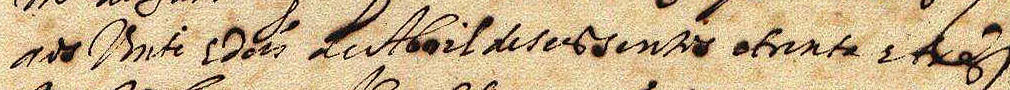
aos Vinte E dois de Abril de seissentos e trinta E tres
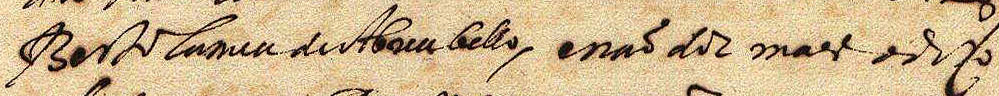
Bertolameu de Abreu bello, e naõ diz maes o dito
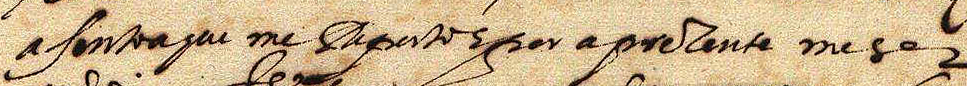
asento a que me Reporto E por a preZente me ser
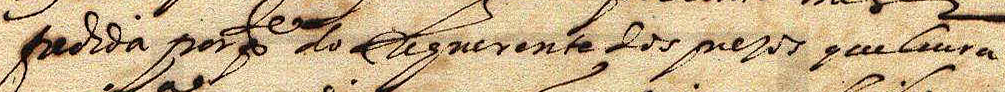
pedida por pte do Requerente dos prezos que liura
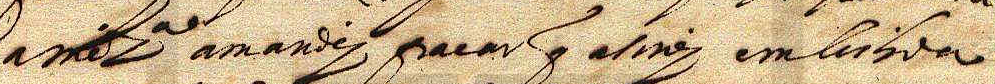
a miZa a mandej pacar q̄ asinej em lisboa
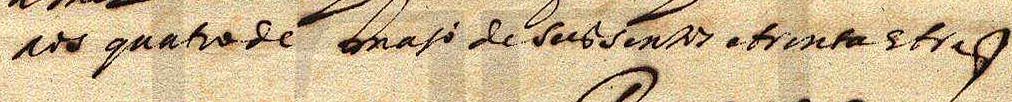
aos quatro de majo de seissentos e trinta E tres
